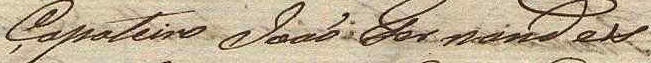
Çapateiro Ioaõ Fernandes
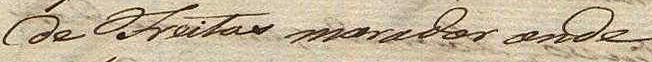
de Freitas morador onde
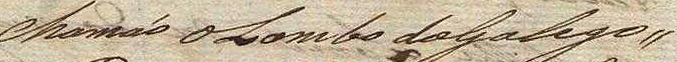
chamaõ o Lombo do Galego
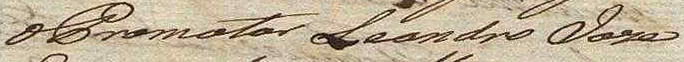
o Promotor Leandro Ioze
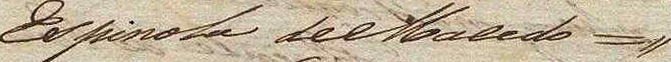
Espinola de Macedo
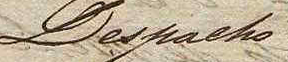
Despacho
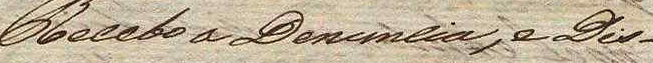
Recebo a Denuncia, e Dis
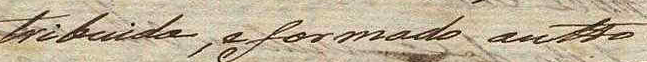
tribuido, e formado autto
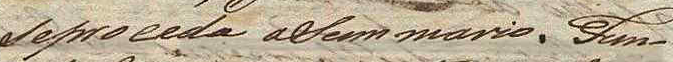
se proceda a Summario. Fun
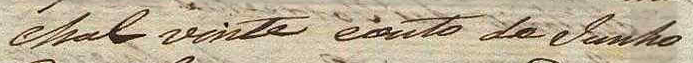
chal vinte e outo de Iunho
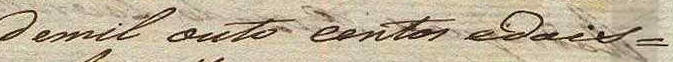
de mil outocentos e dois
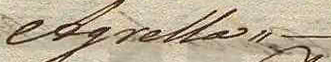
Agrella
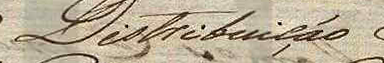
Distribuição
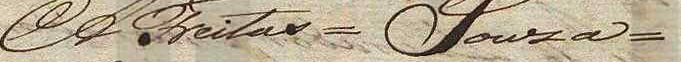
A Freitas = Souza
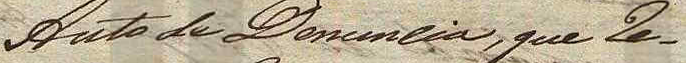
Auto de Denuncia, que Re
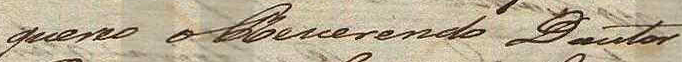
quereo o Reuerendo Doutor
